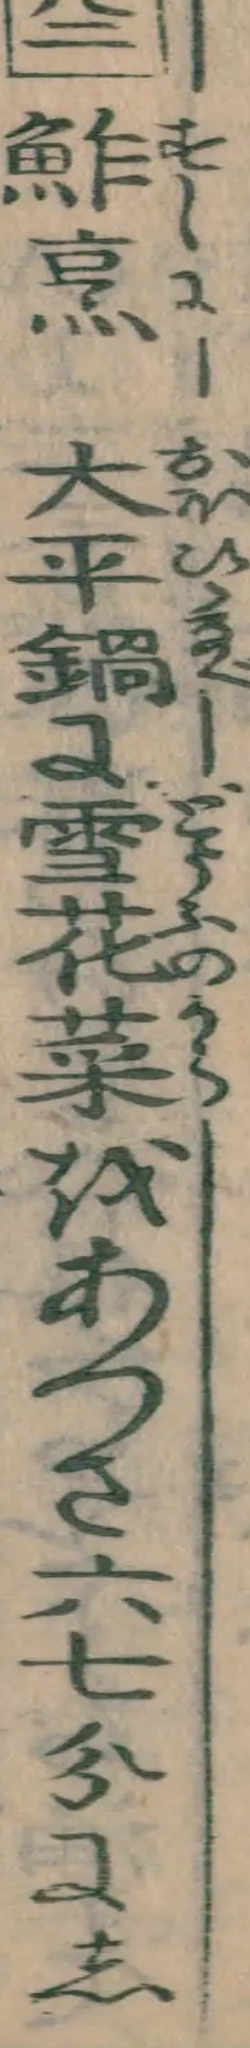廿二鮓烹大平鍋に雪花菜をあつさ六七分にし
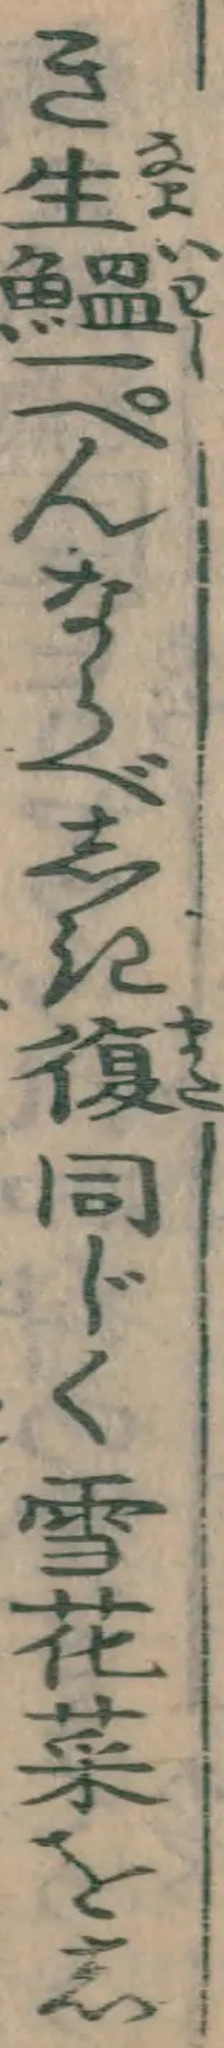き生鰮一ぺんならべしき復同じく雪花菜をし
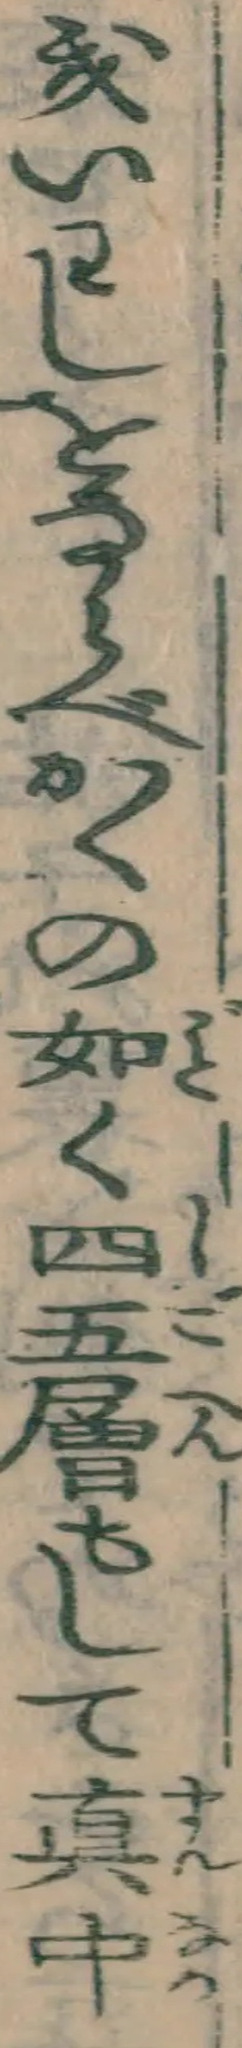きいわしをならべかくの如く四五層もして真中
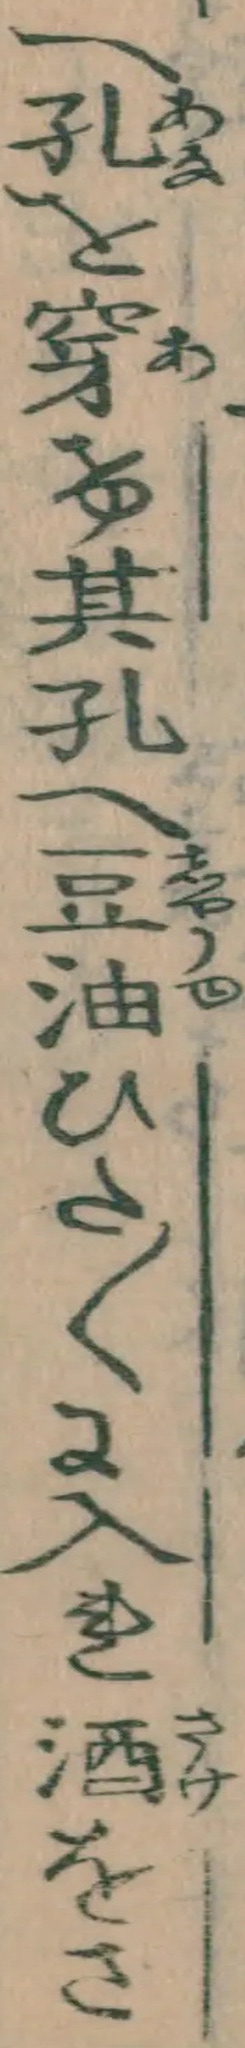へ孔を穿け其孔へ豆油ひた〳〵に入れ酒をさ
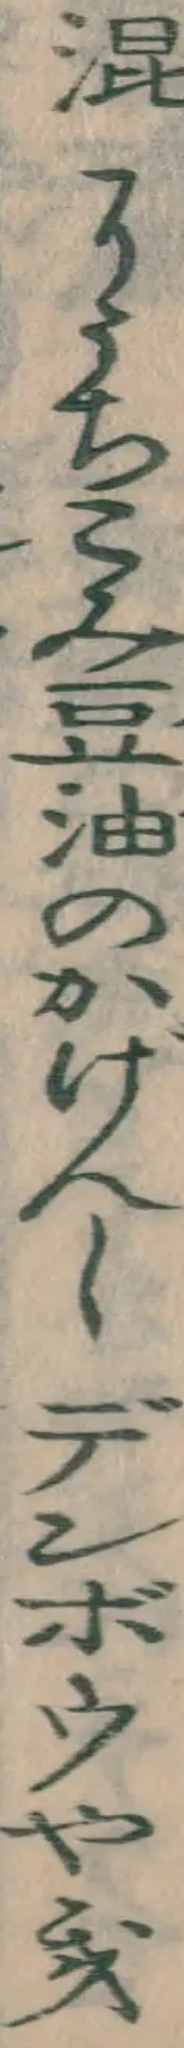混にうちこみ豆油のかげんにしデンボウやき
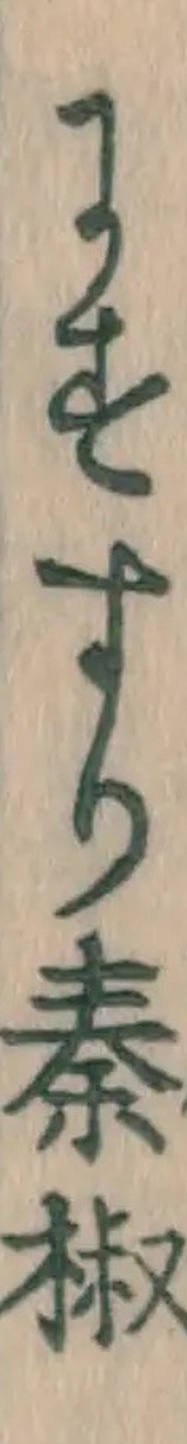にすすり秦椒
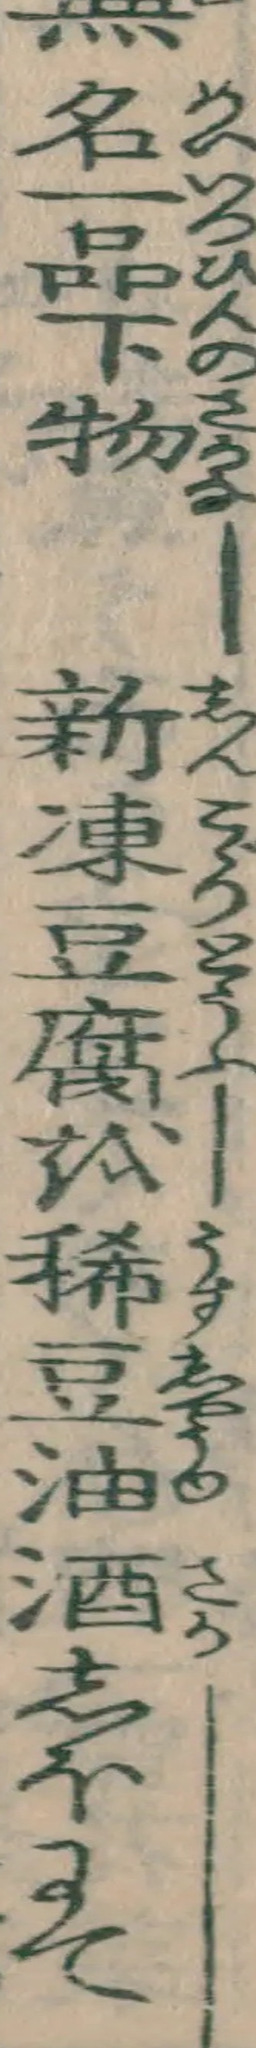廿四無名一品下物新凍豆腐を稀豆油酒しほにて
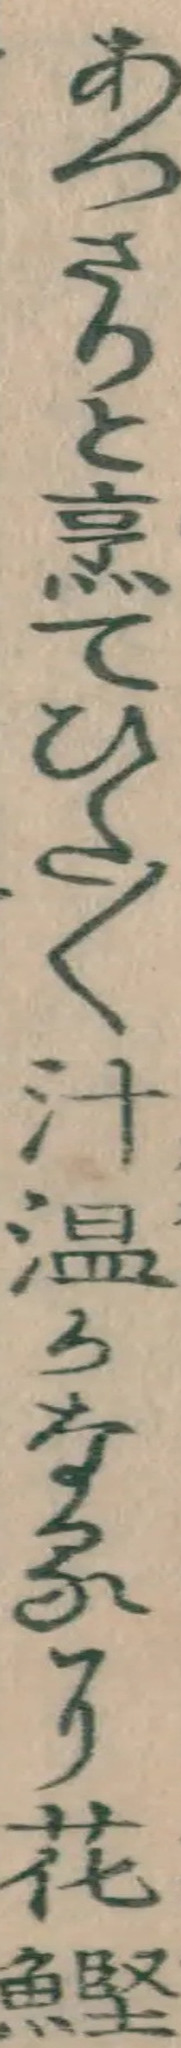あつさりと烹てひた〳〵汁温かなるに花鰹
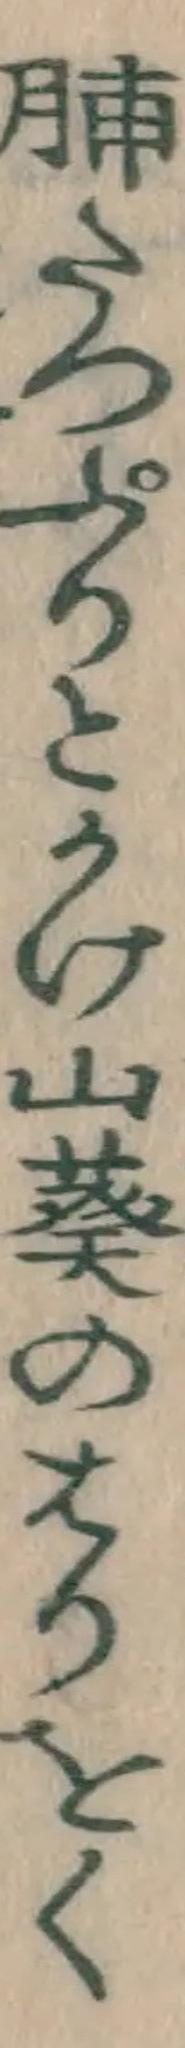脯たつぷりとかけ山葵のはりをく
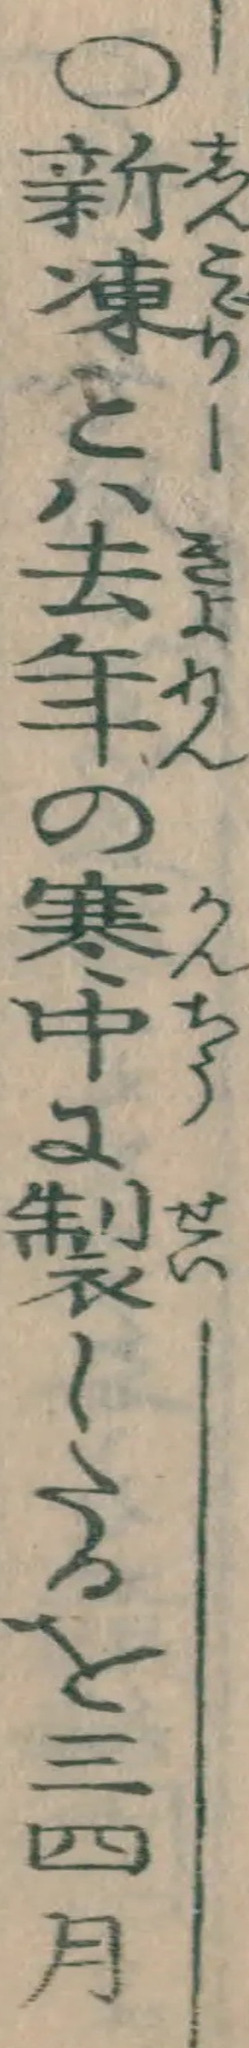○新凍とは去年の寒中に製したるを三四月

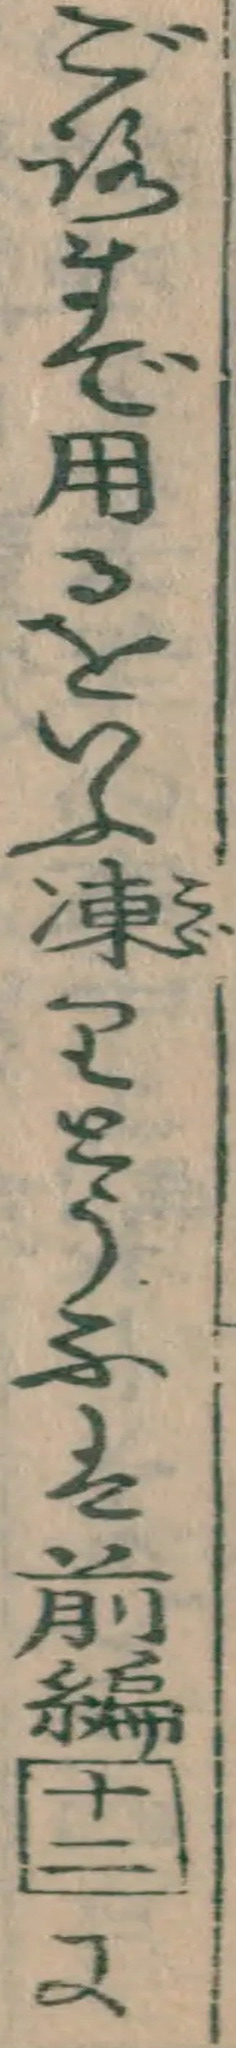ごろまで用るをいふ凍りとうふは前編十二に
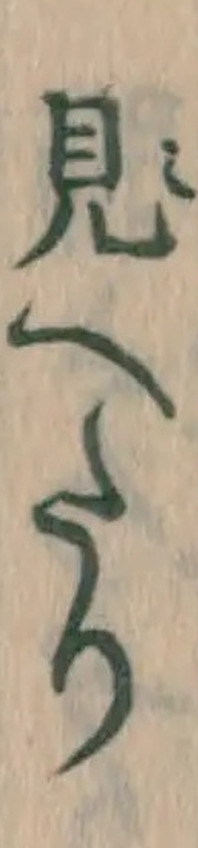見へたり
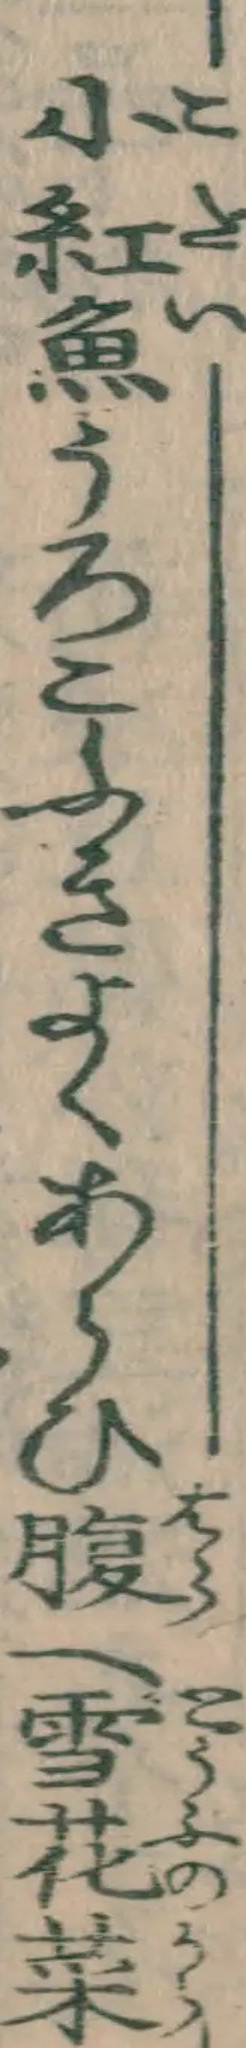廿五又小紅魚うろこふきよくあらひ腹へ雪花菜
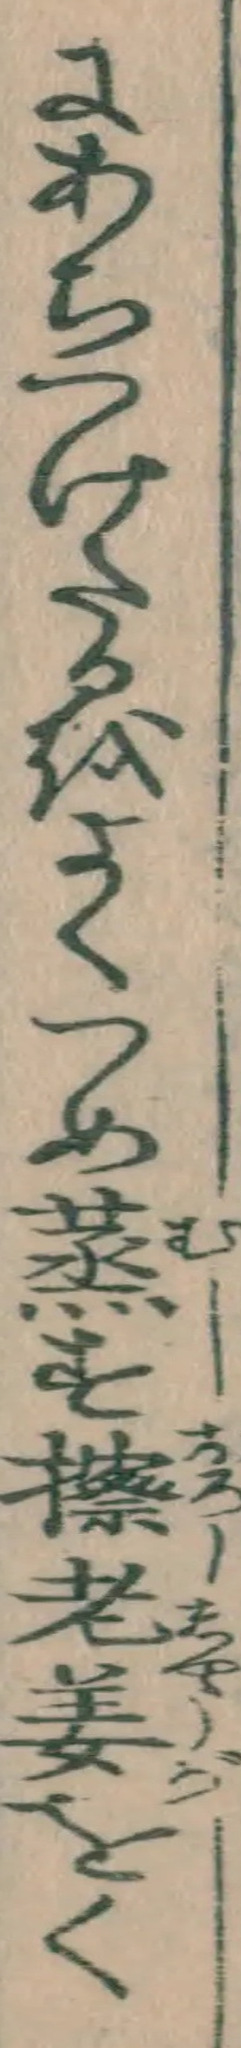にあちつけたるをよくつめ蒸す擦老姜をく
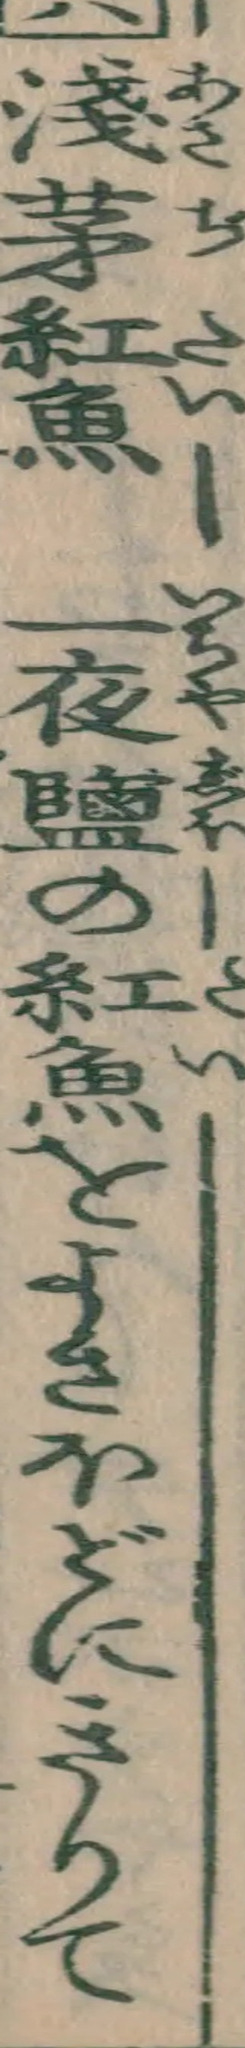廿六浅茅紅魚一夜塩の紅魚をよきほどにきりて
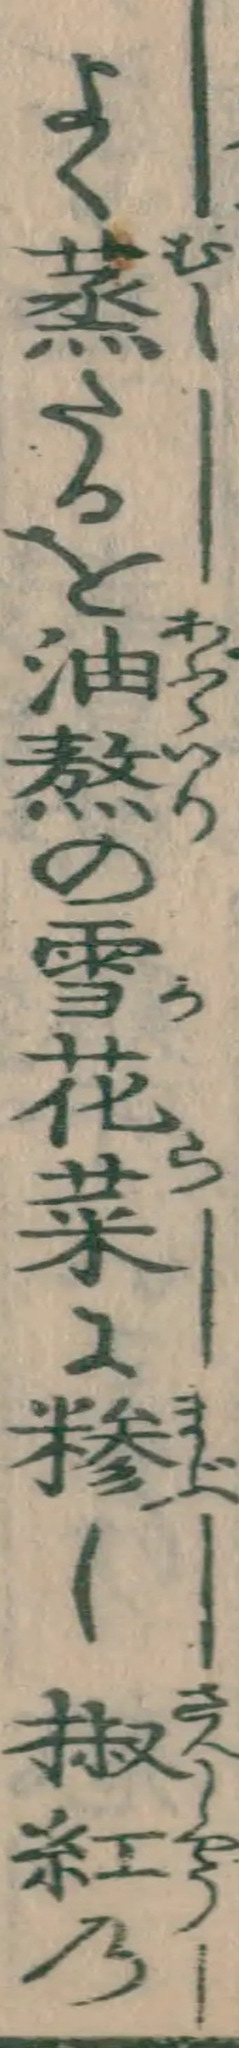よく蒸たるを油熬の雪花菜に糝し椒紅の
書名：豆腐百珍. 続編
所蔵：国立国会図書館 National Diet Library, JAPAN
